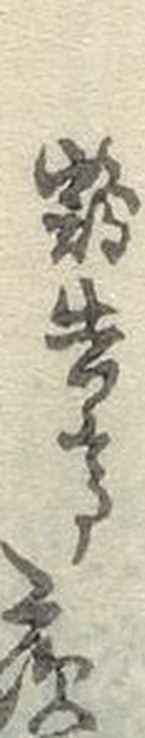鶴告亭
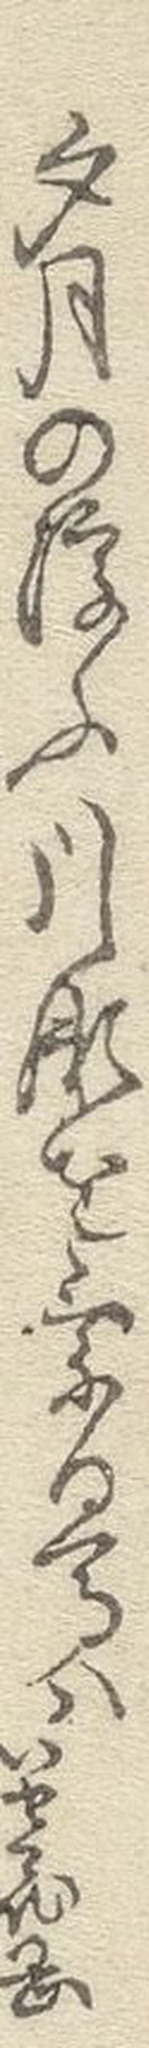夕月の浮ふ川瀬を乗る馬はいセ花息
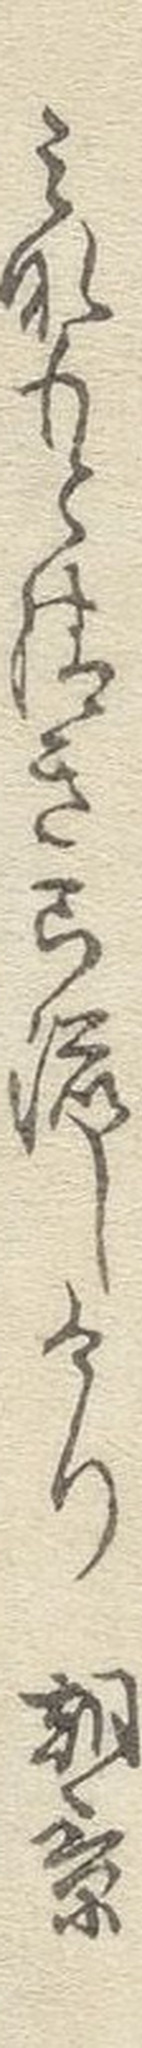みなもと清き弓流しけり浅景
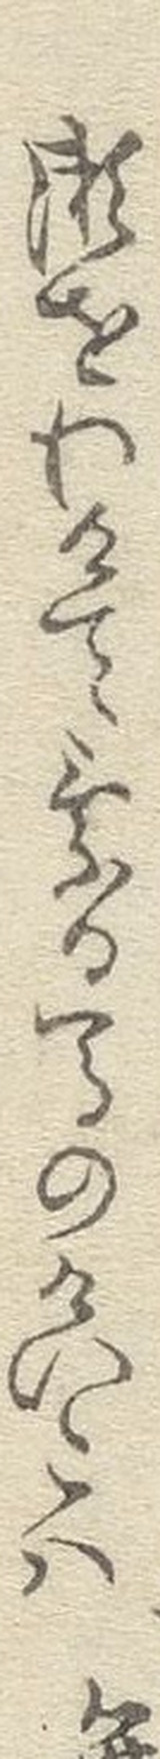瀬をわけて乗る馬のけいこは笹好
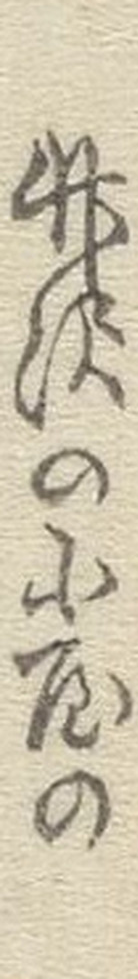竹沢の小屋の
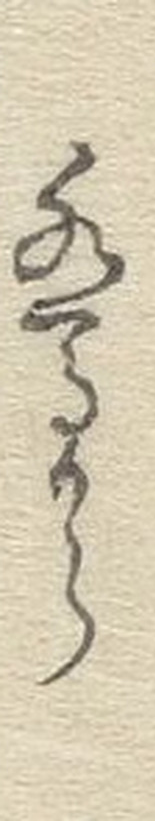水馬から
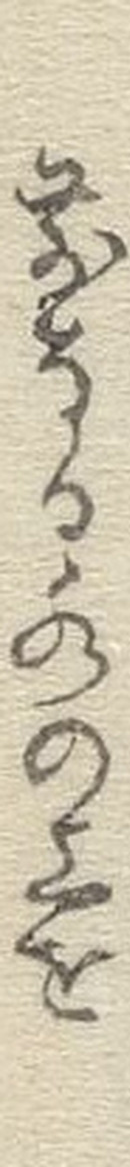前なる水の上を
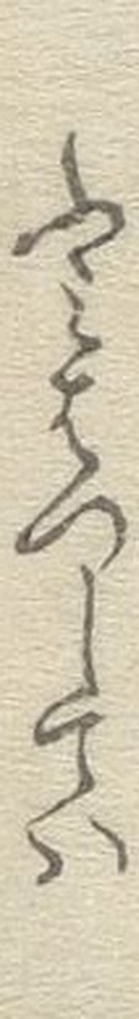ふみはつしては
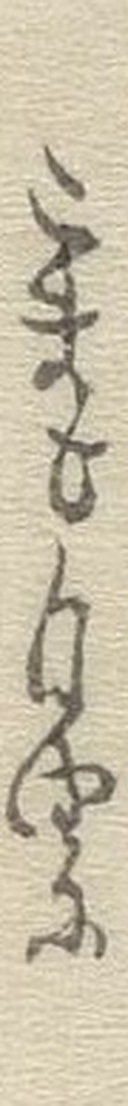こまも自由に
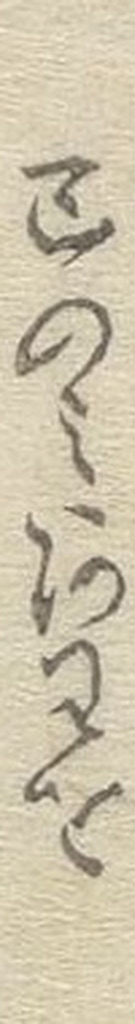己のみあわを
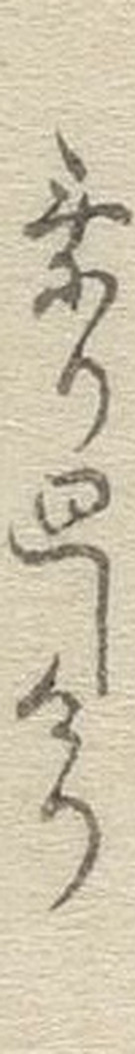乗り廻しけり
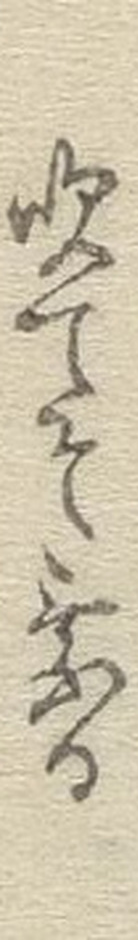吹てそ乗る
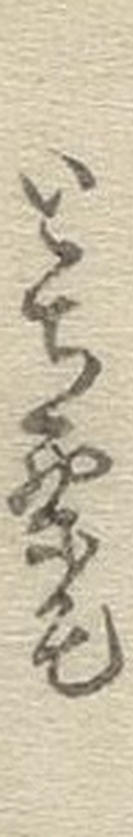とち栗毛
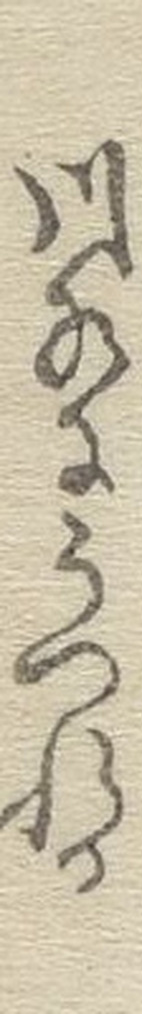川水にうつれる
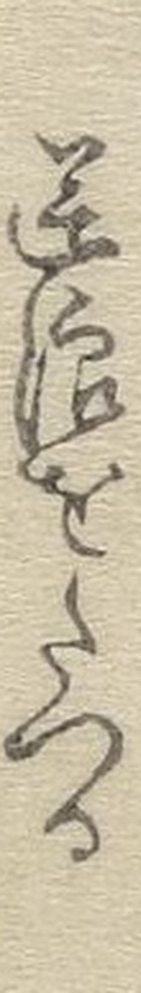逆波をたつる
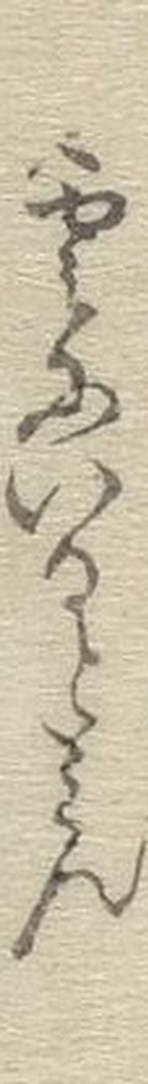雲にいるとみん
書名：Picture Album of People with Kyōka (Light Verse) (Kyōka shiki jinbutsu 狂歌四季人物)
